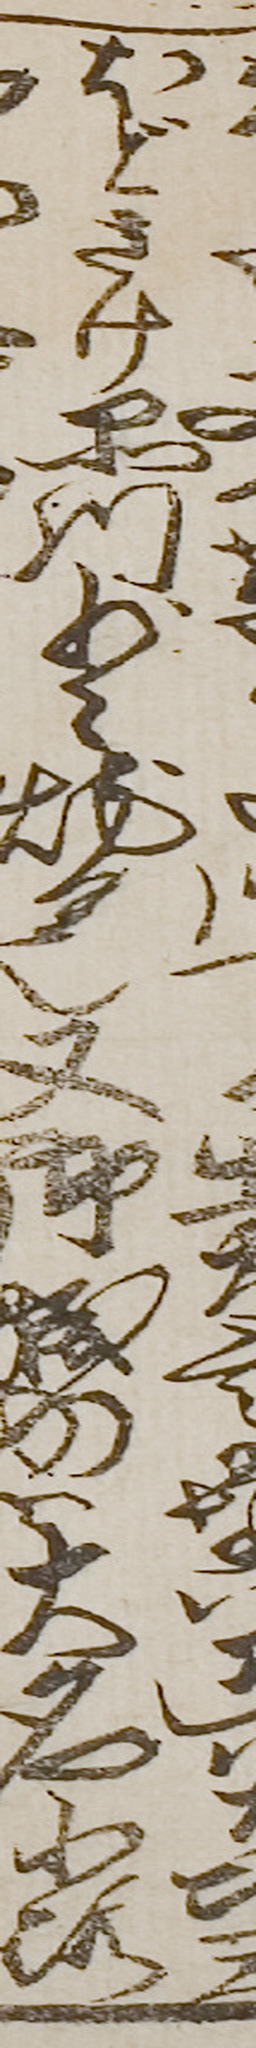ほどさけ品川少々焼る也又御城内は大名小路
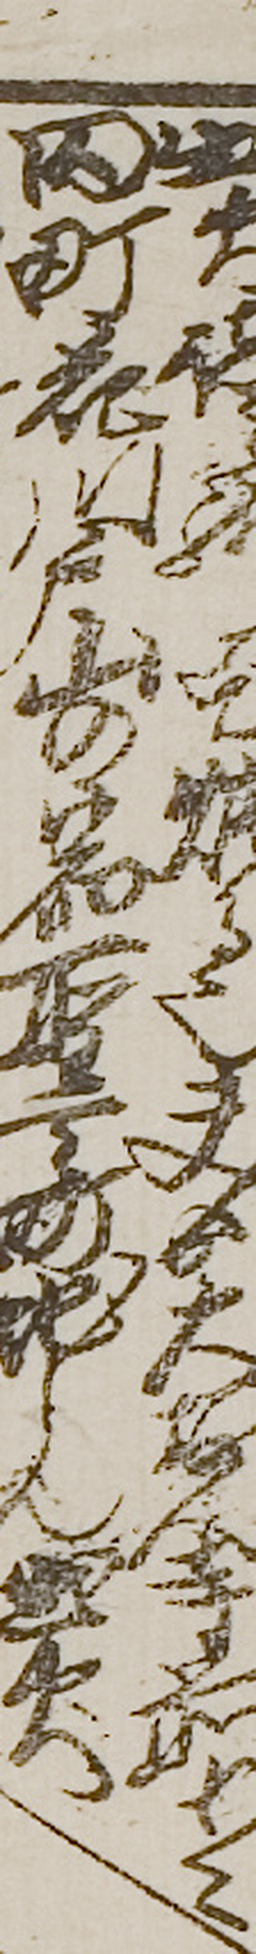田町花川戸山の宿聖天町地しん出火
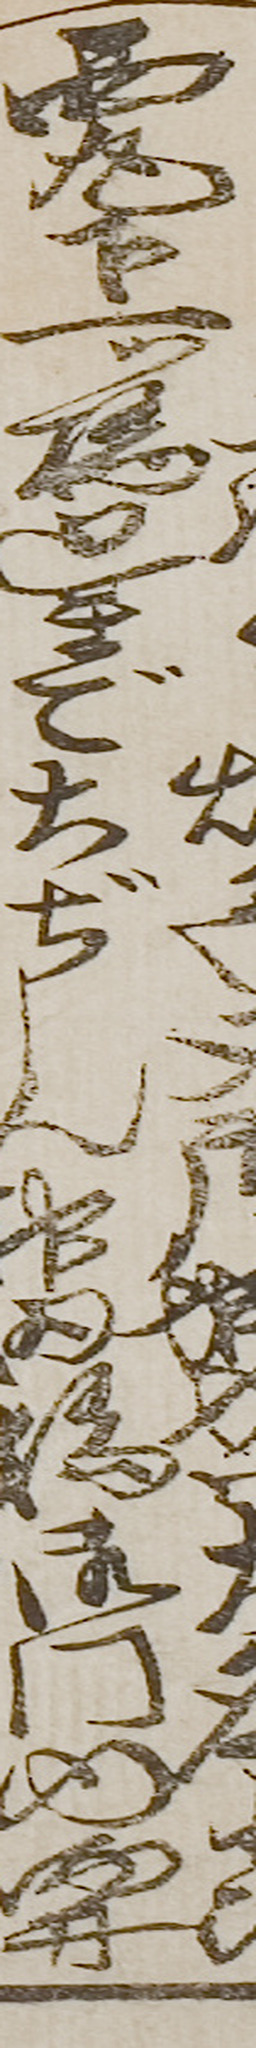西丸下一ツ橋辺まで大ぢしん神田橋御門内酒井
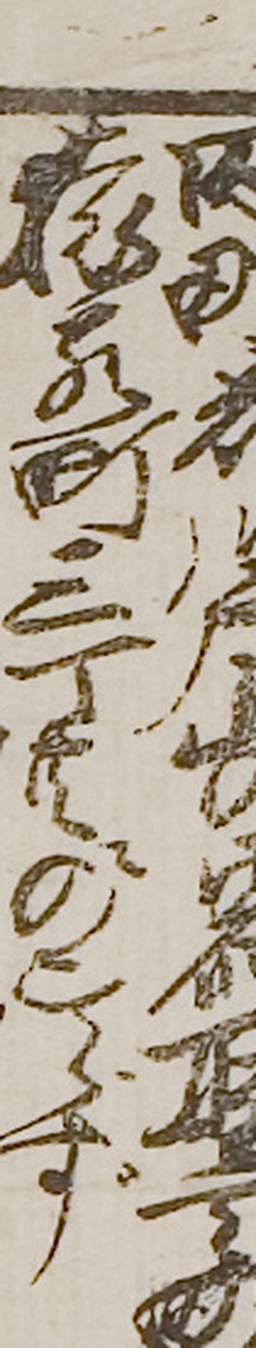猿若町三丁共にのこらず
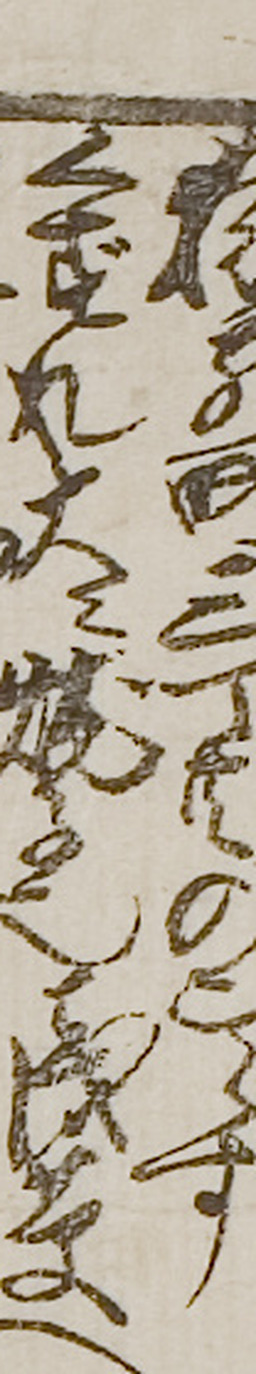くずれ大に焼る也浅草
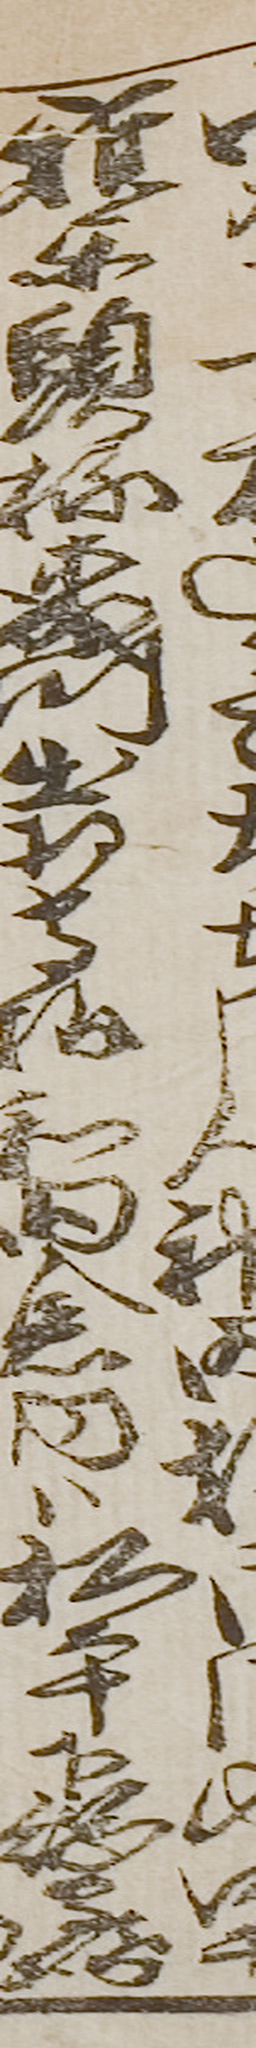雅楽頭様森川出羽守様和田倉内は松平下総守様
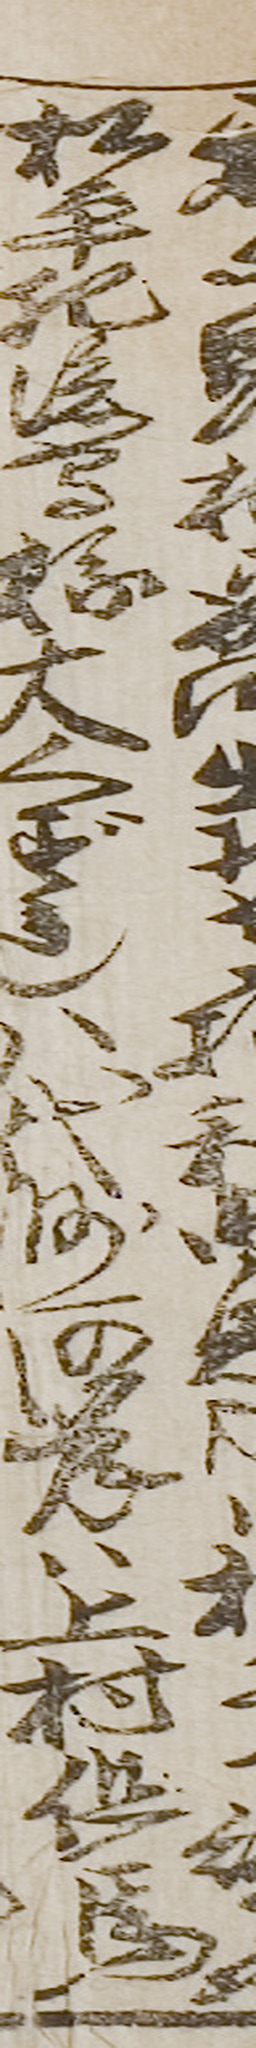松平肥後守様大くずれ八代洲河岸は上村但馬
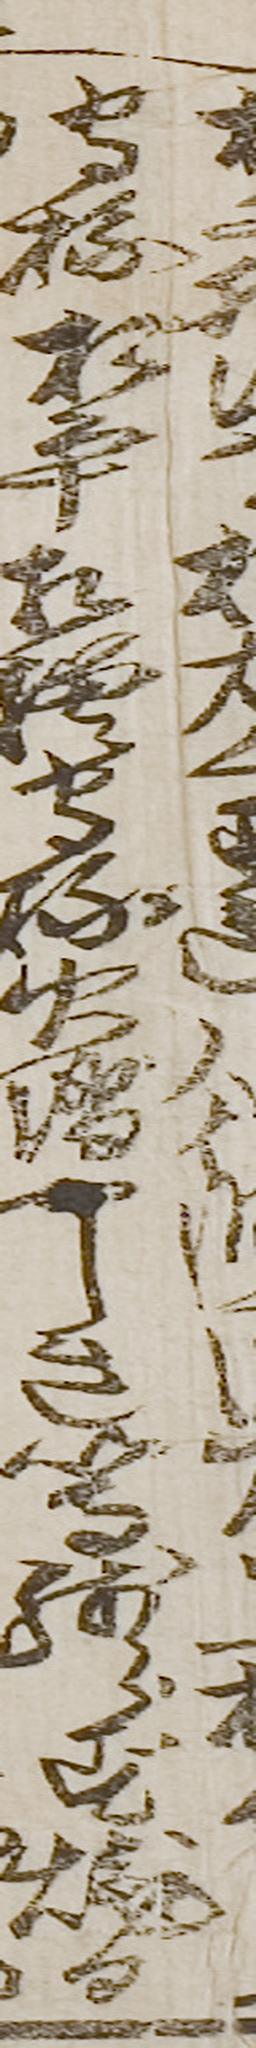守様松平相模守様火消やしき等残らず焼る
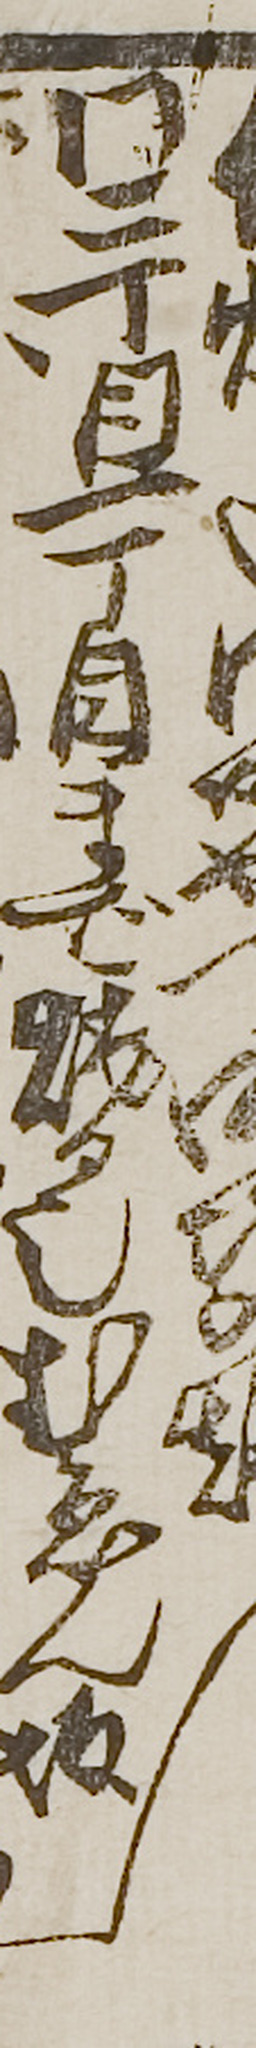同二丁目一丁目まで焼る也むゑん坂
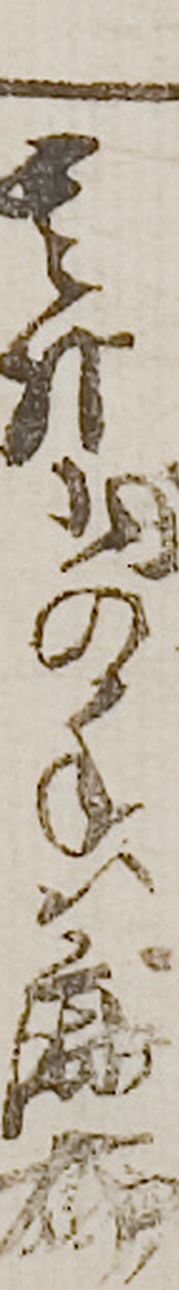其外山の手は麻布
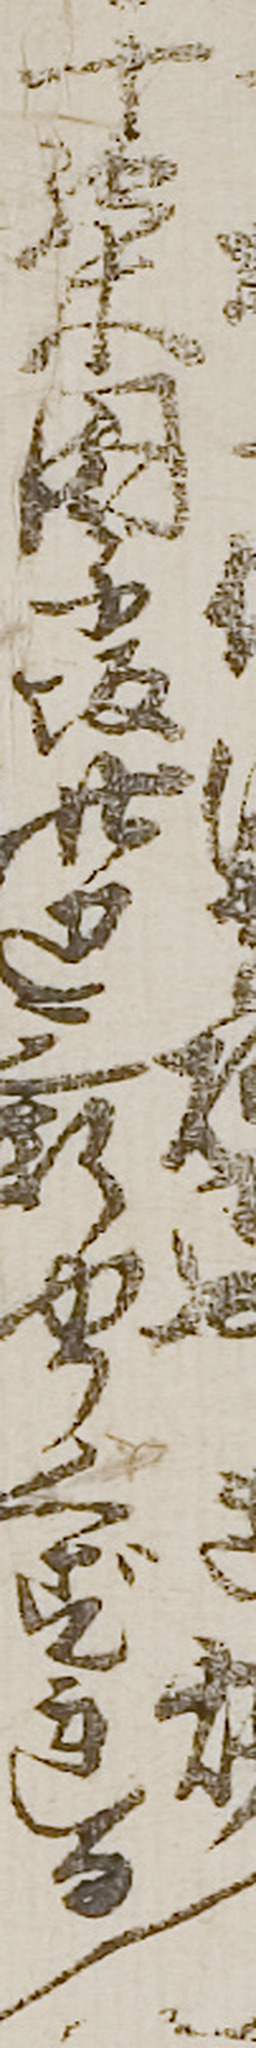千駄木団子坂此辺三軒やけくずれる
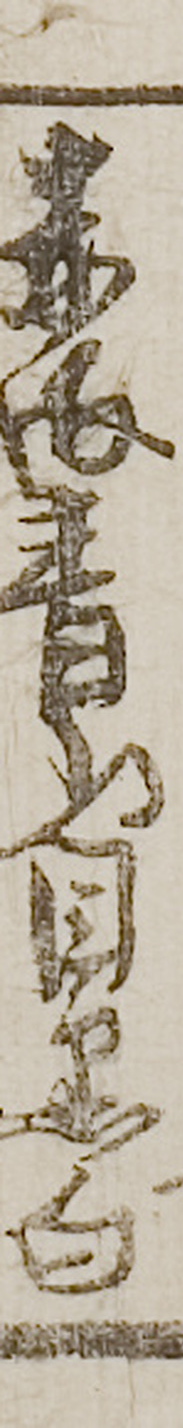赤坂青山目黒白
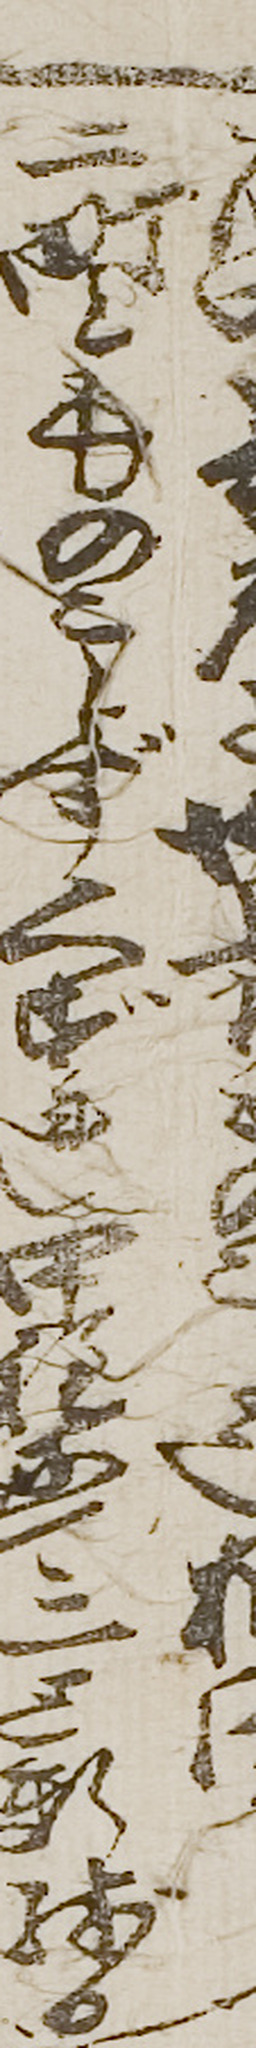二町とものこらずくずれ中程にて二三軒残る
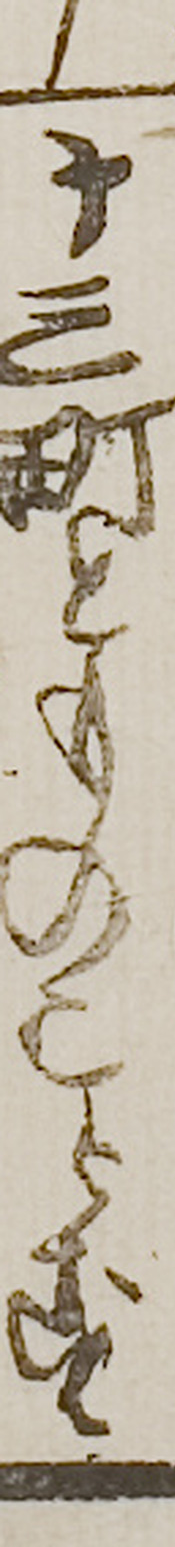十三町とものこらず
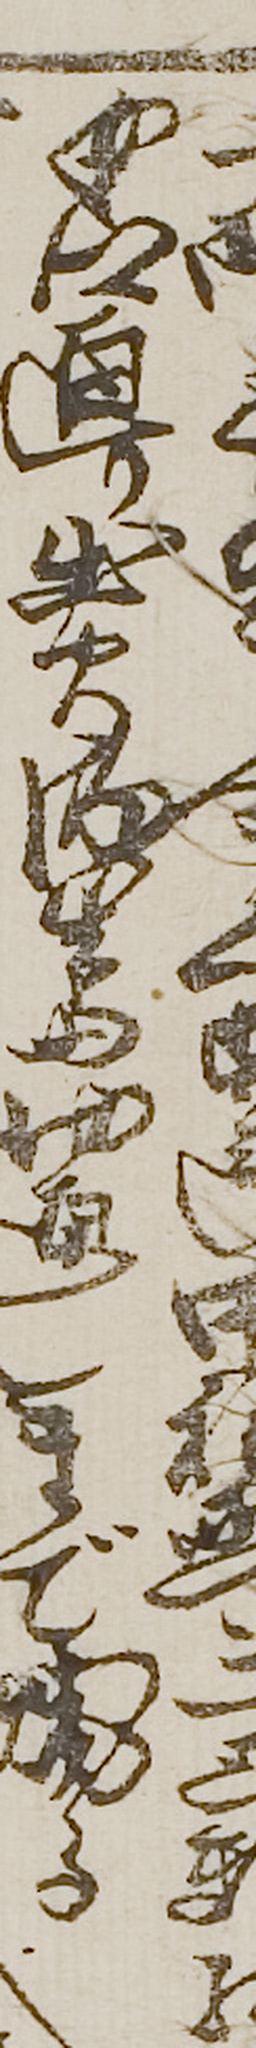本郷通り出火湯島切通しまで焼る
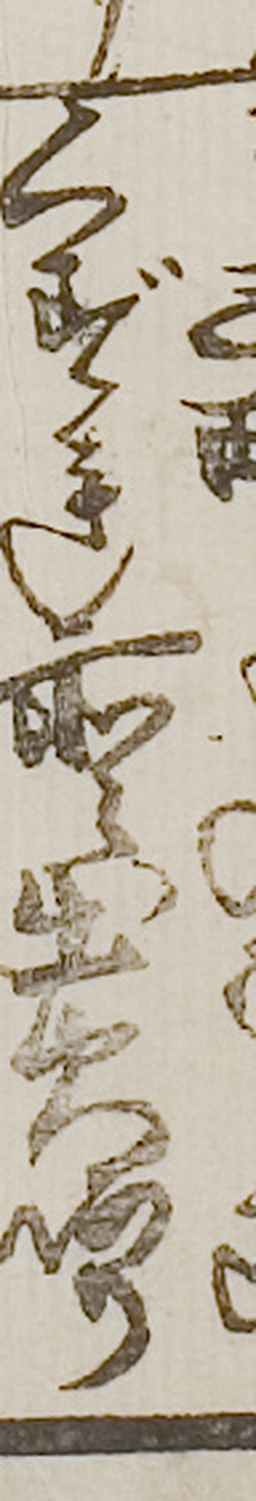くずれ所々出火あり
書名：[江戸大地震]
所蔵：東京大学総合図書館 General Library in the University of Tokyo, JAPAN
